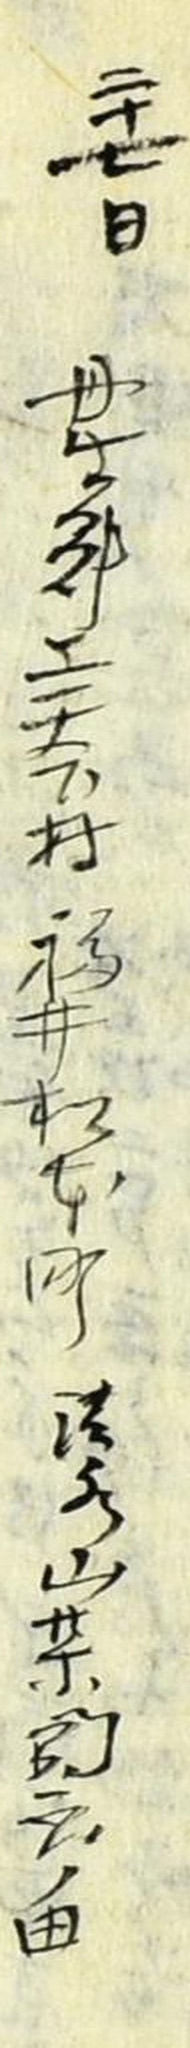二十七日丹生郡上天下村福井松本町清水山某関取ノ由
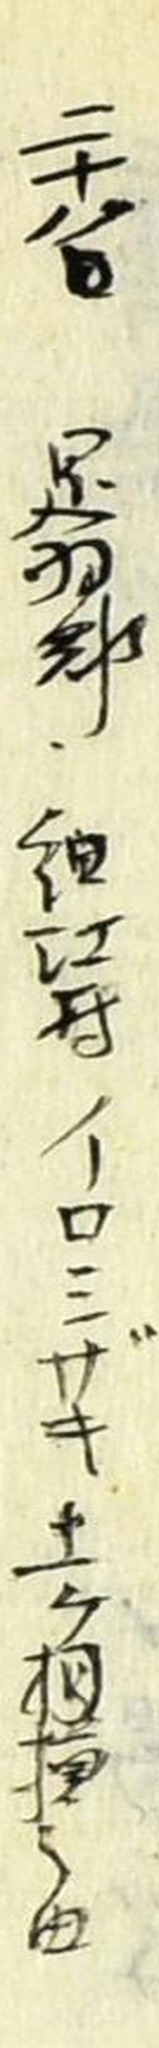二十八日足羽郡細江村イロシザキ上ヶ相撲之由
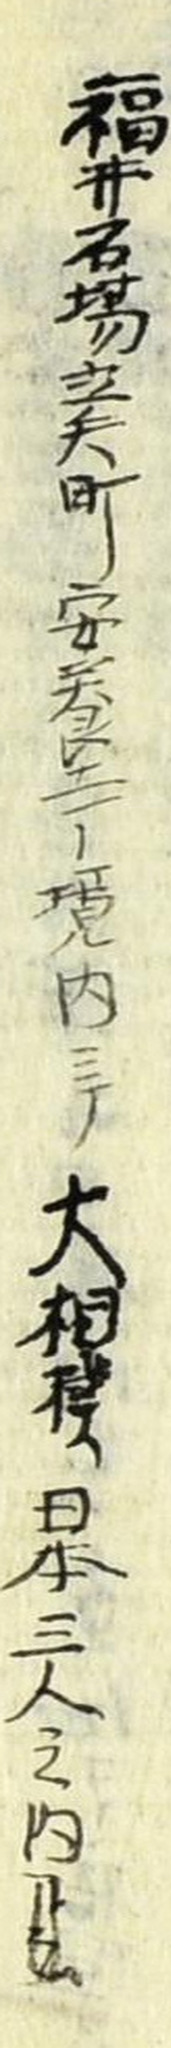福井石場立矢町安養寺境内ニテ大相撲日本三人之内
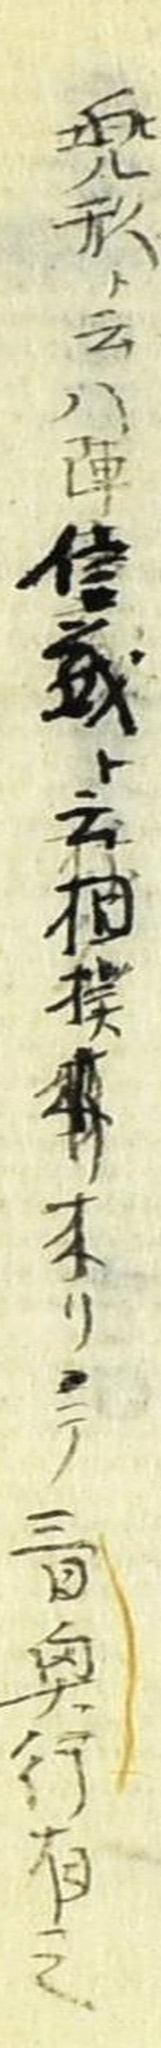兜形ト云八陣信蔵ト云相撲来リテ三日興行有之
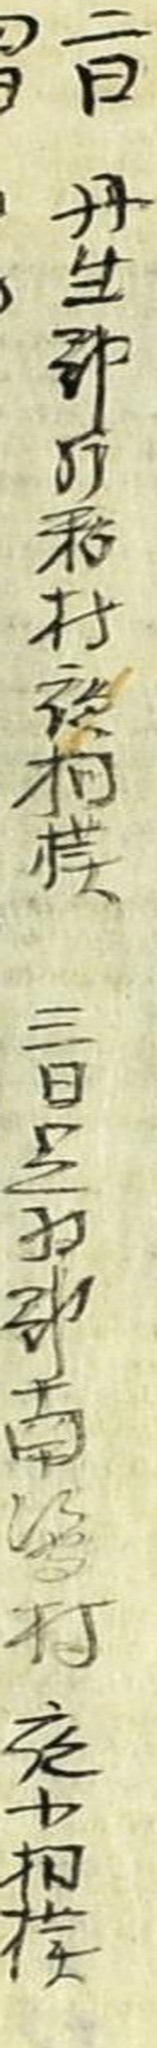二日丹生郡片粕村夜相撲三日足羽郡南江守村夜小相撲
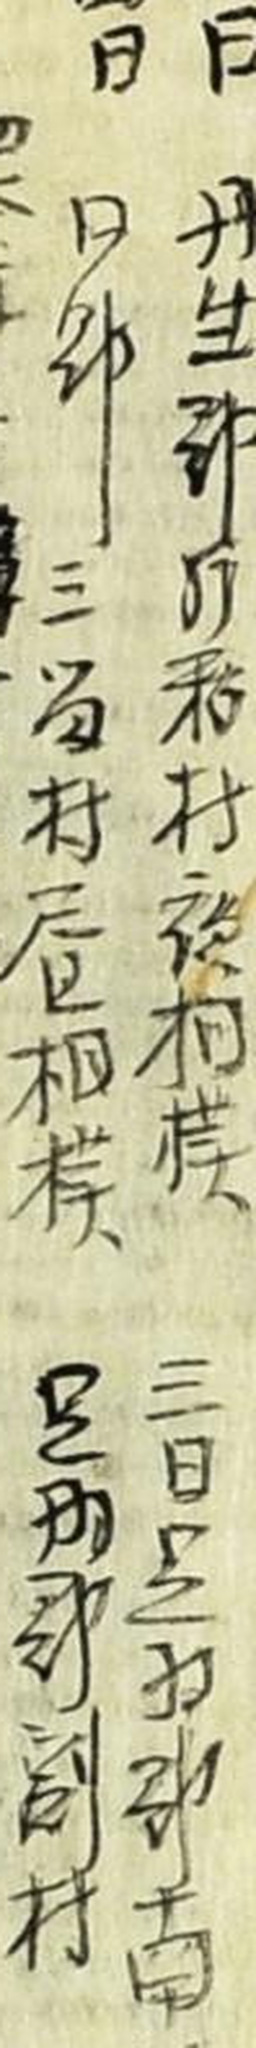四日同郡三留村昼相撲足羽郡淵村
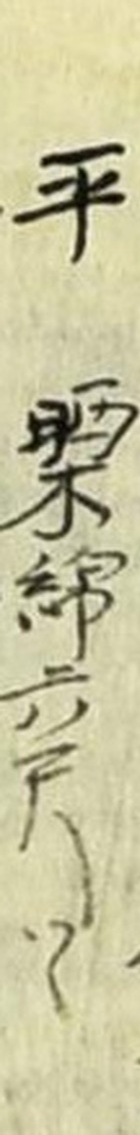平晒木綿六尺ツヽ
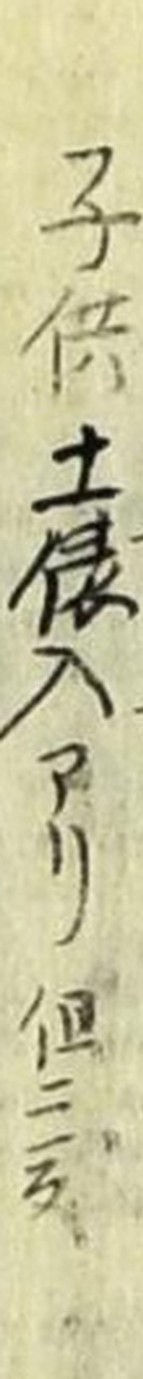子供土俵入アリ但二度
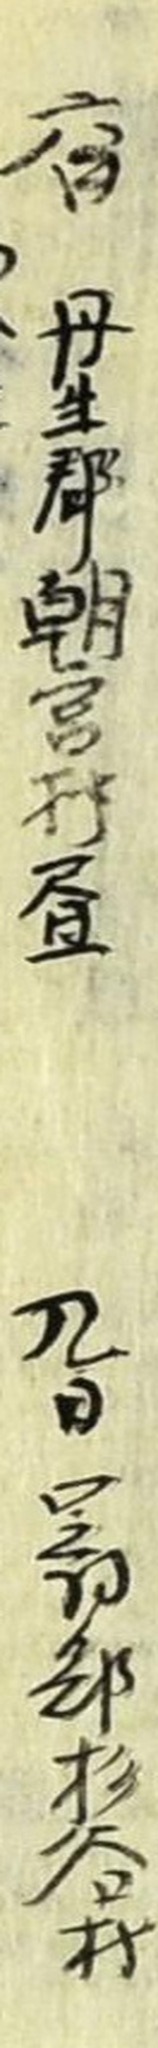六日丹生郡朝宮村昼九日足羽郡杉谷村
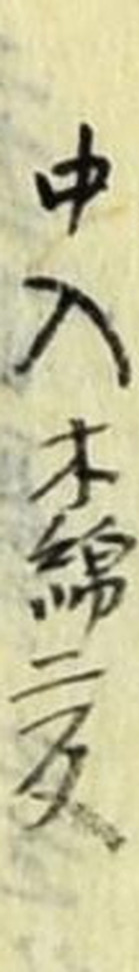中入木綿二反
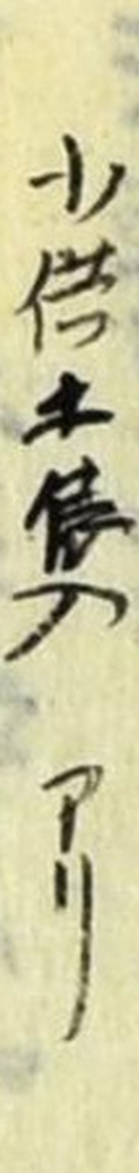子供土俵入アリ

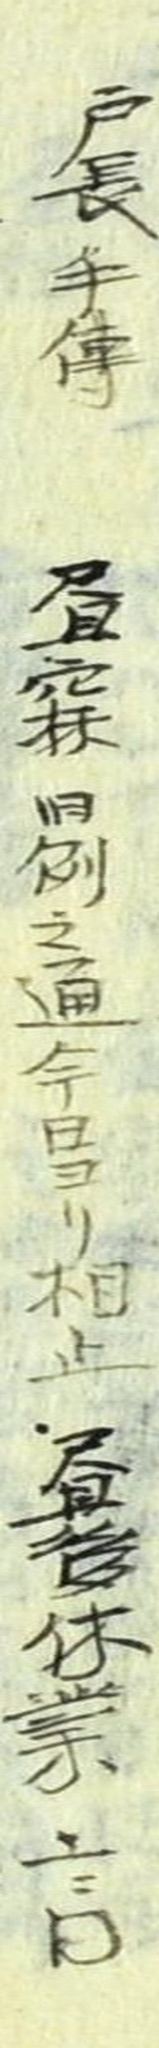戸長手伝昼寝旧例之通今日ヨリ相止昼後休業上ニ同
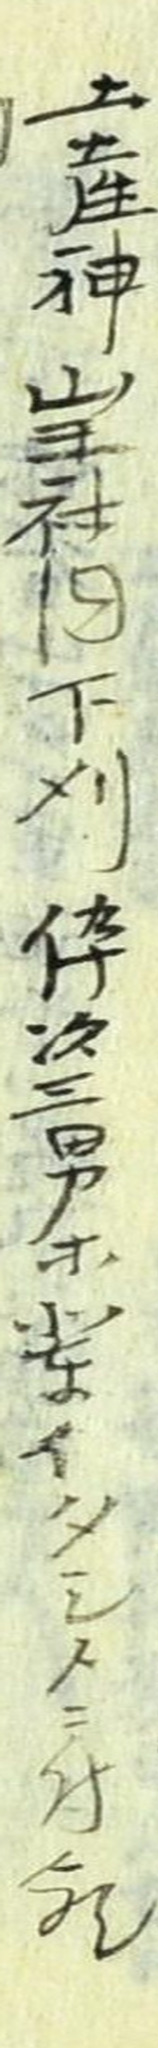土産神山王社内下刈倅次三男等輩イタシ候ニ付歟
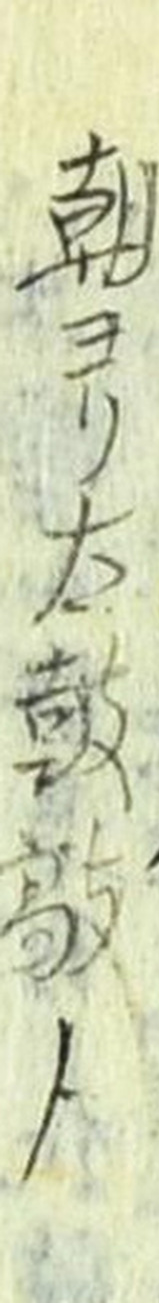朝ヨリ太鼓敲候
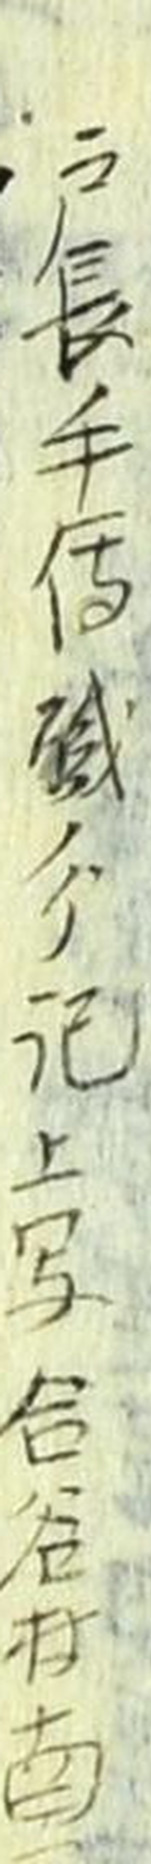戸長手伝職分記上写合谷村南居村
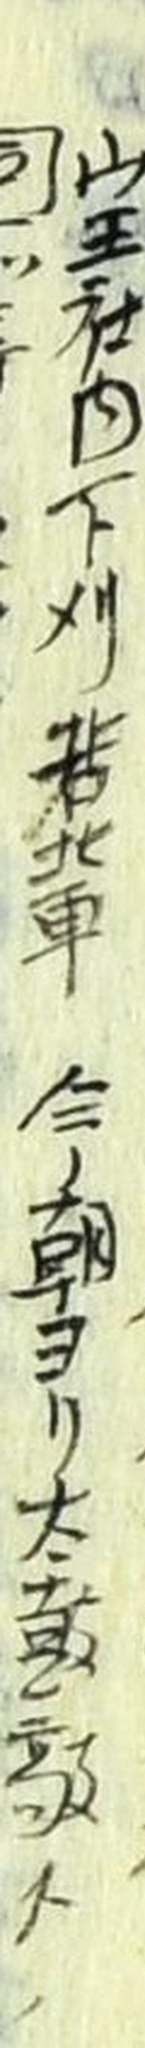山王社内下刈若輩今朝ヨリ太鼓敲候
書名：（日記）
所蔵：福井県文書館 Fukui Prefectural Archives
